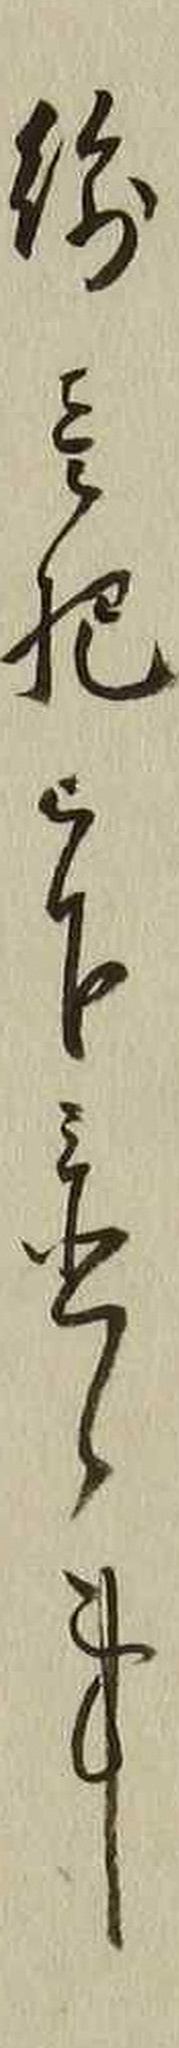綿壱把被下置候事
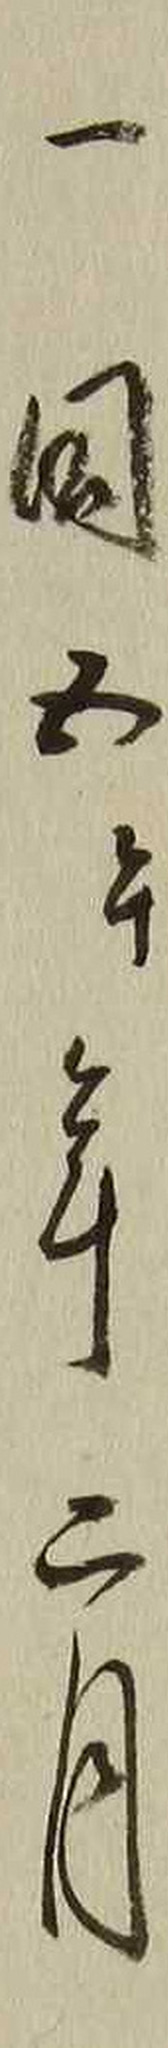一同五午年二月
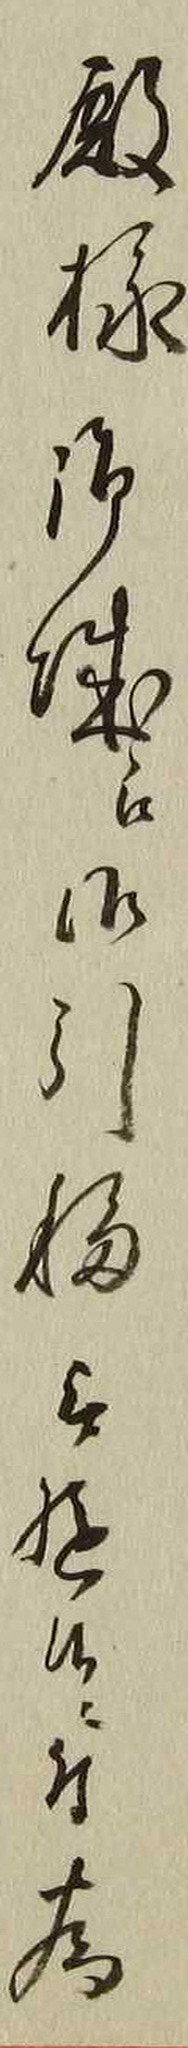殿様御城江御引移被遊候ニ付為
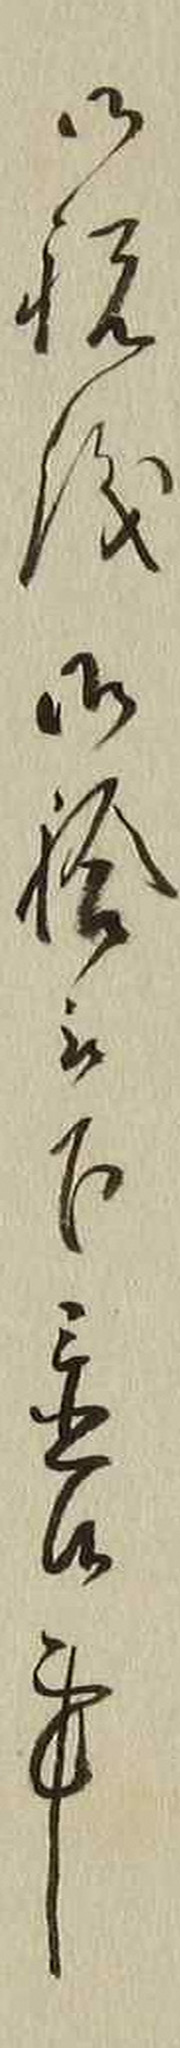御祝儀御袷被下置候事
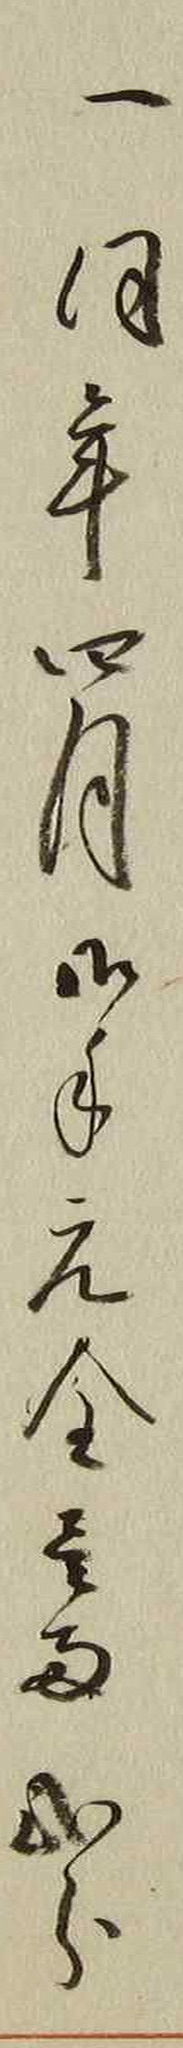一同年四月御手元金壱両弐分
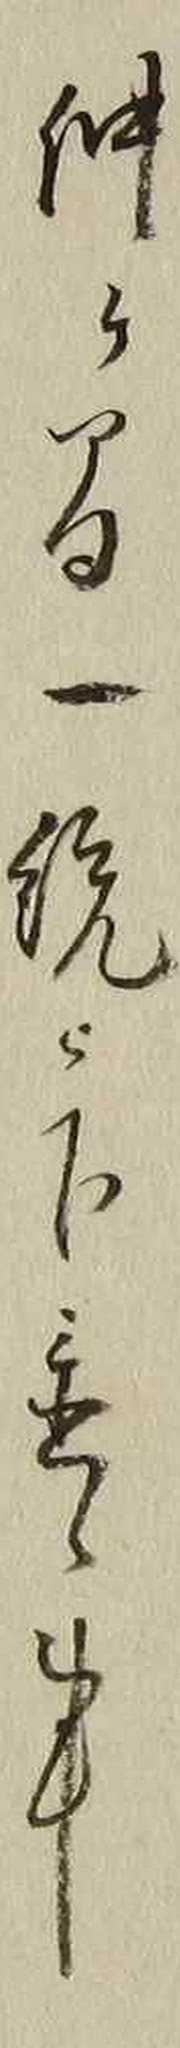仲ケ間一統被下置候事
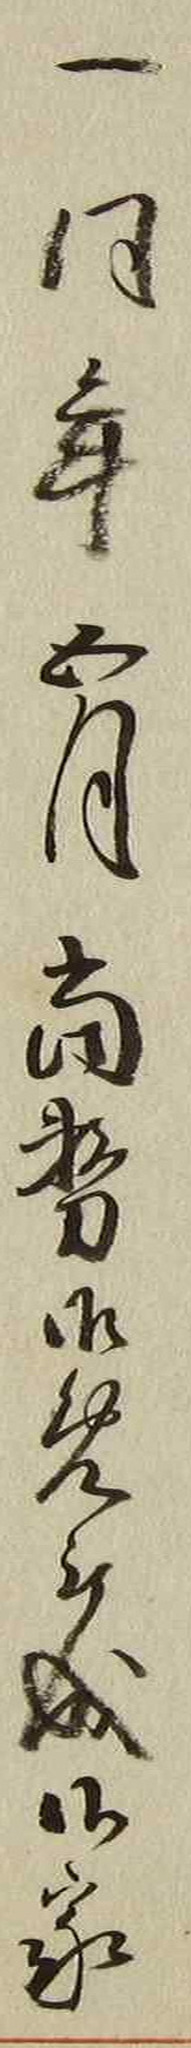一同年五月当務御免被成御家
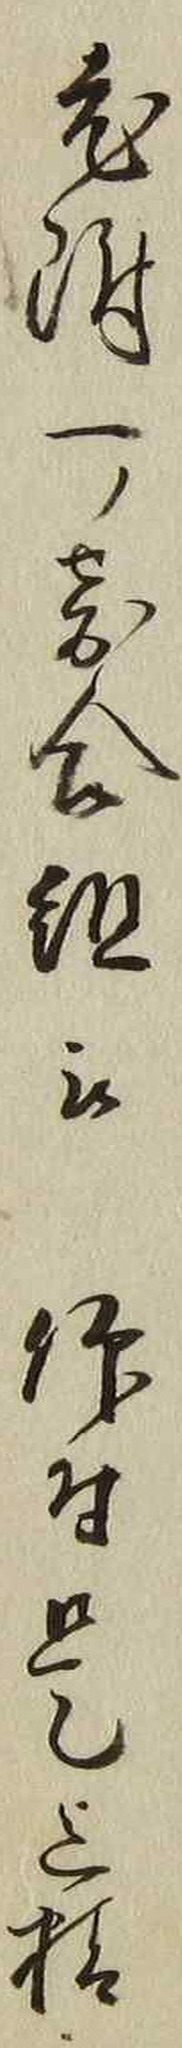老附一ノ寄合組被仰付是迄精
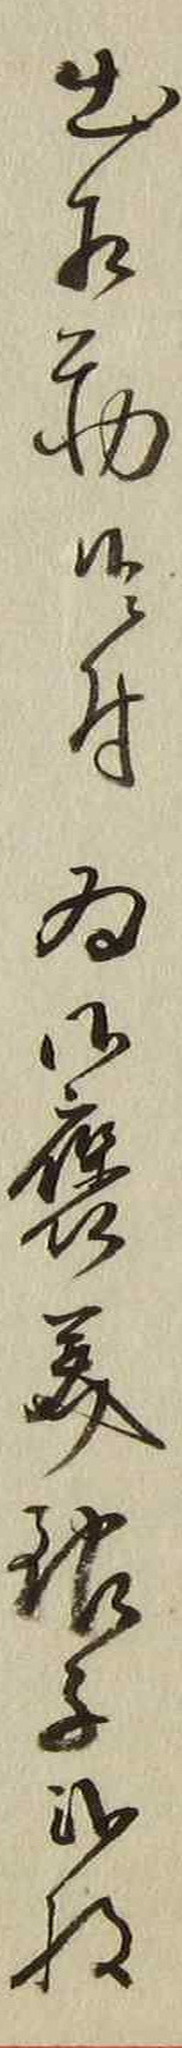出相勤候ニ付為御褒美銀子弐枚
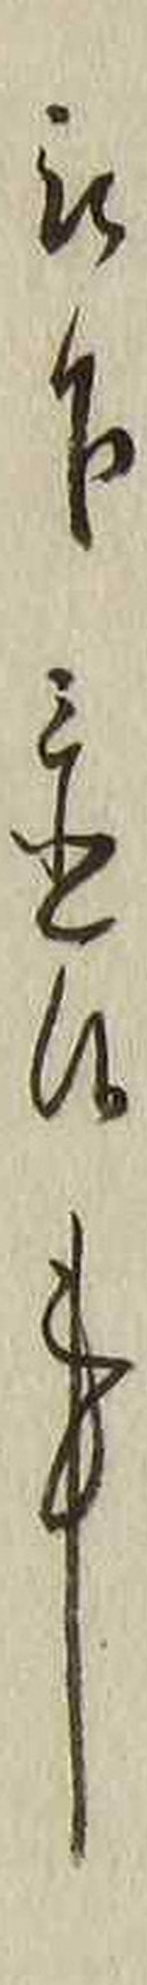被下置候事

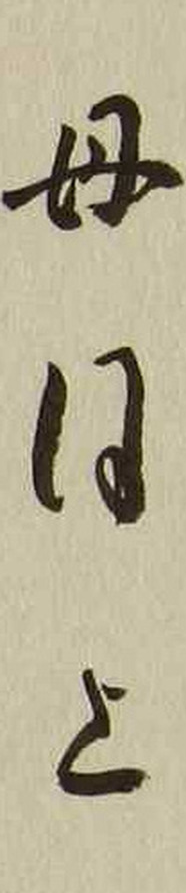母同上
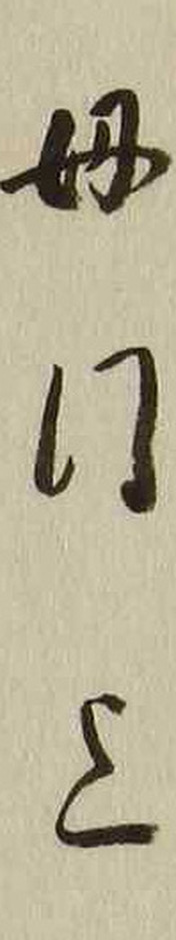母同上
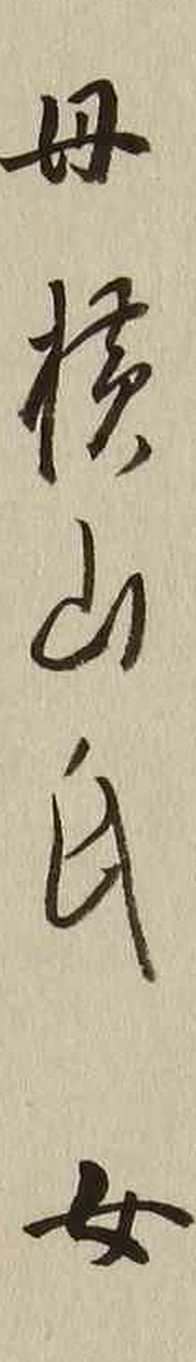母横山氏女
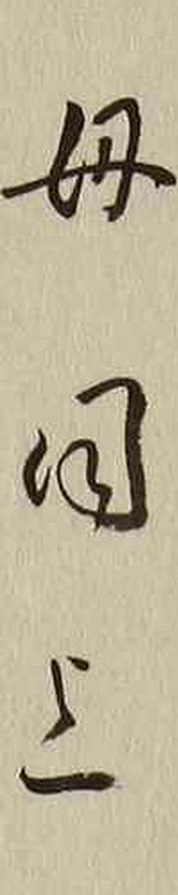母同上
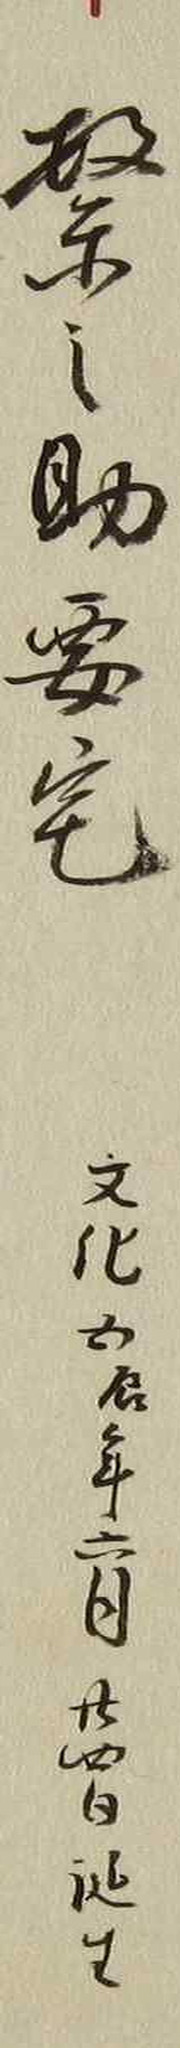繁之助要宅文化五辰年六月廿四日誕生
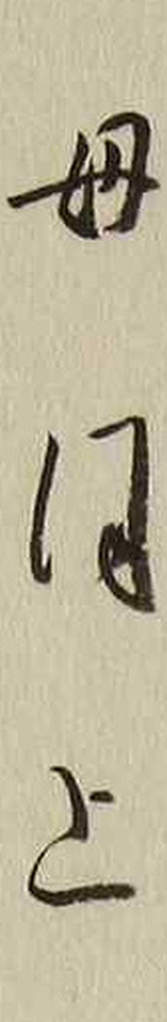母同上
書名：諸士系譜　巻之32　い之部32
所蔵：会津若松市立会津図書館
